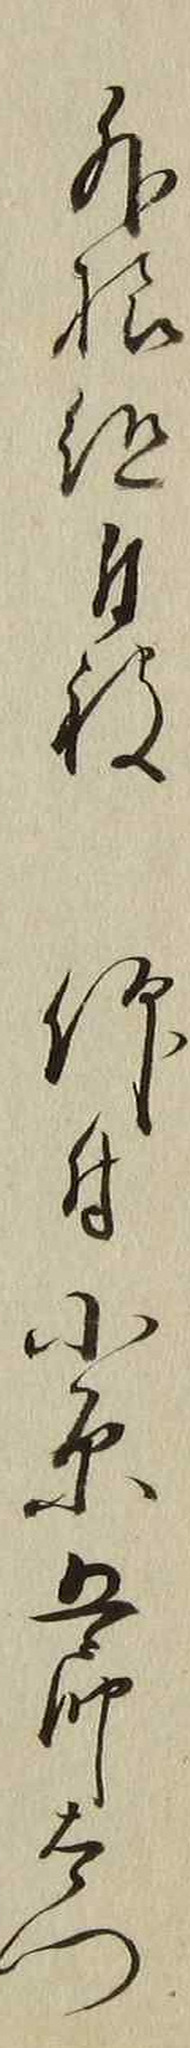外様組付被仰付小原五郎右衛門
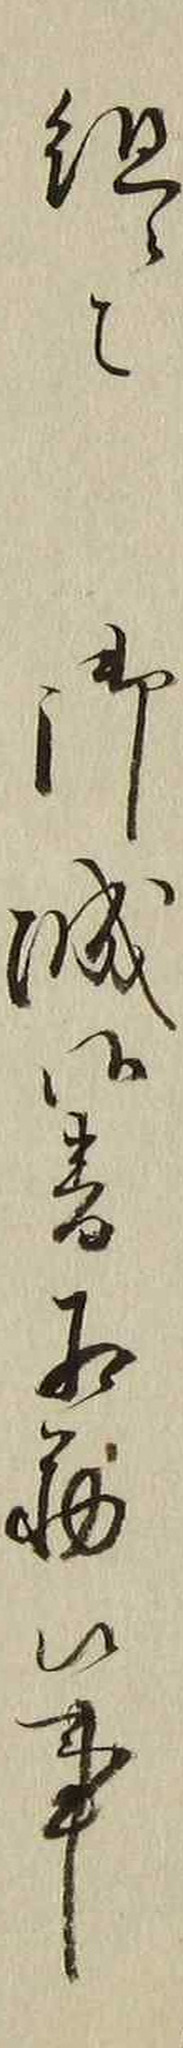組ニて御城御番相勤候事
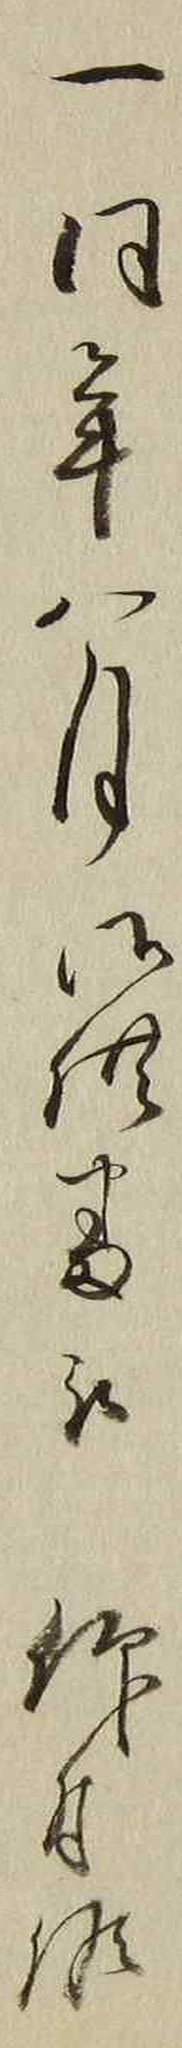一同年八月御供番被仰付候
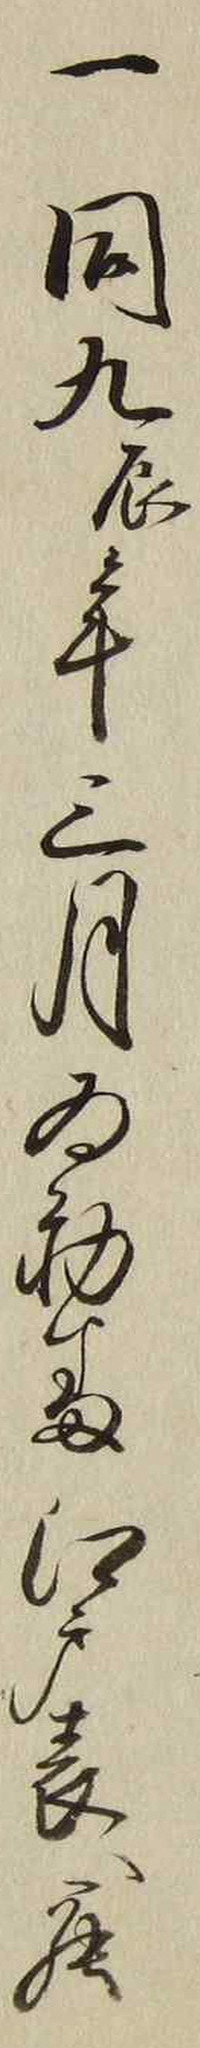一同九辰年三月為勤番江戸表へ罷
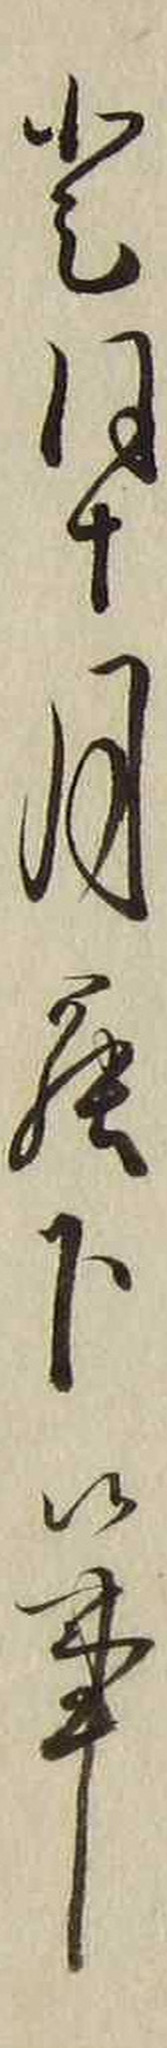登同十月罷下候事

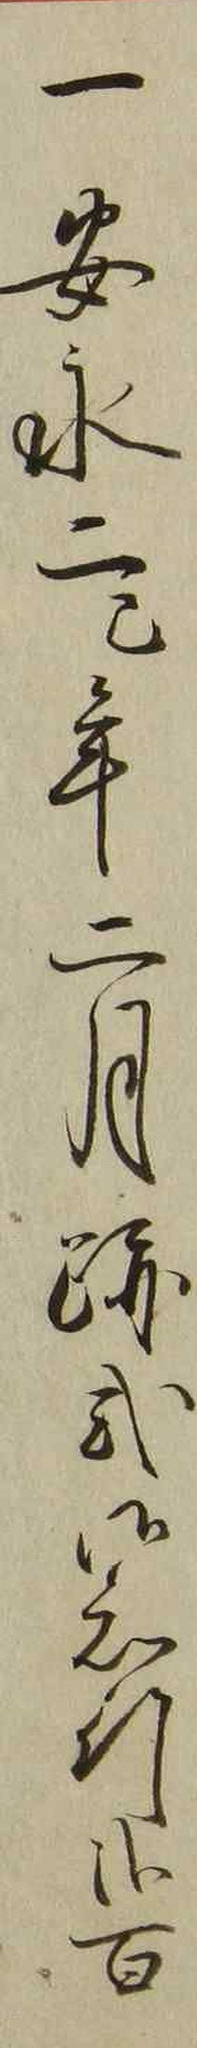一安永二巳年二月跡式御知行弐百
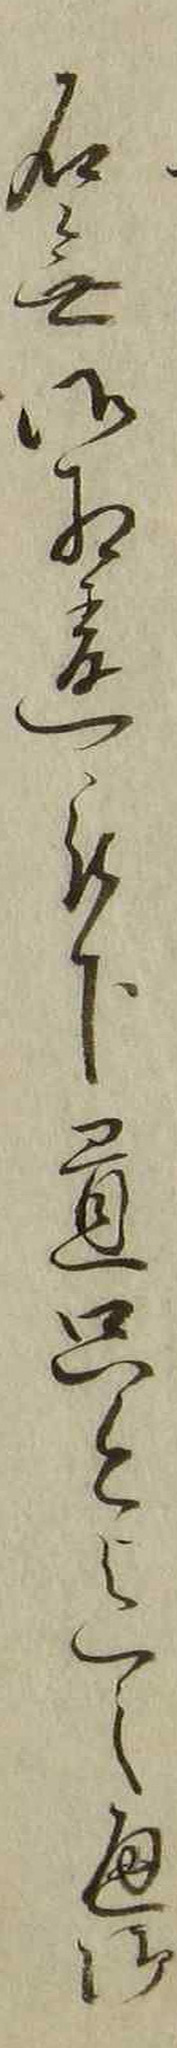石無御相違被下置只今迄之通御
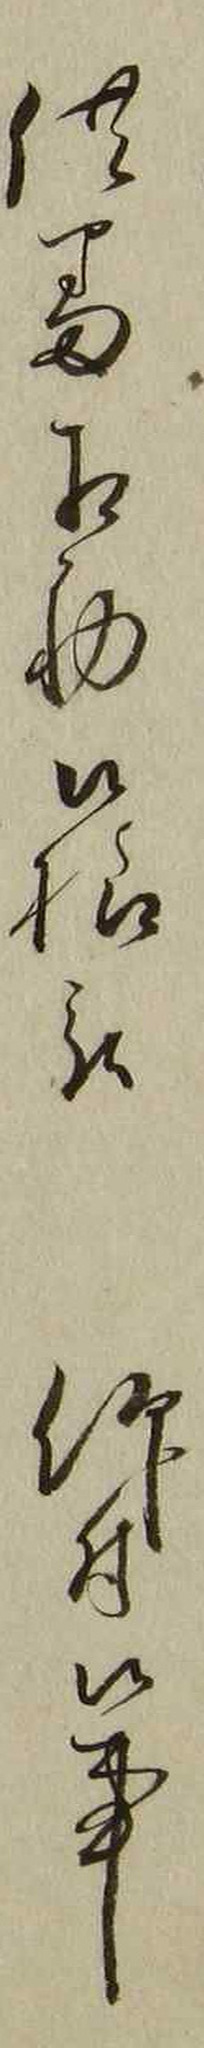供番相勤候様被仰付候事
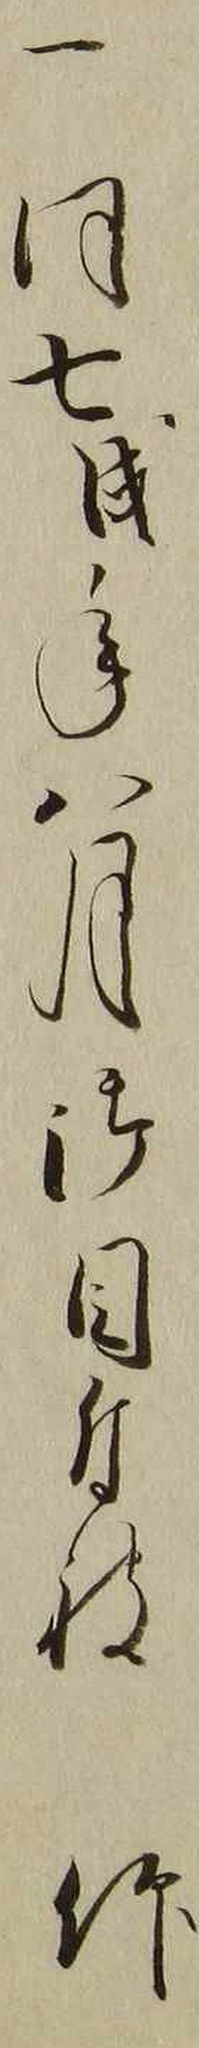一同七戌年八月御目付被仰
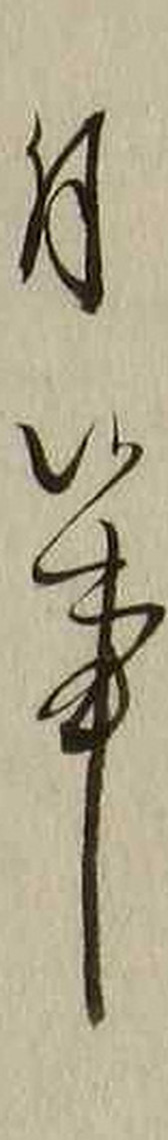付候事
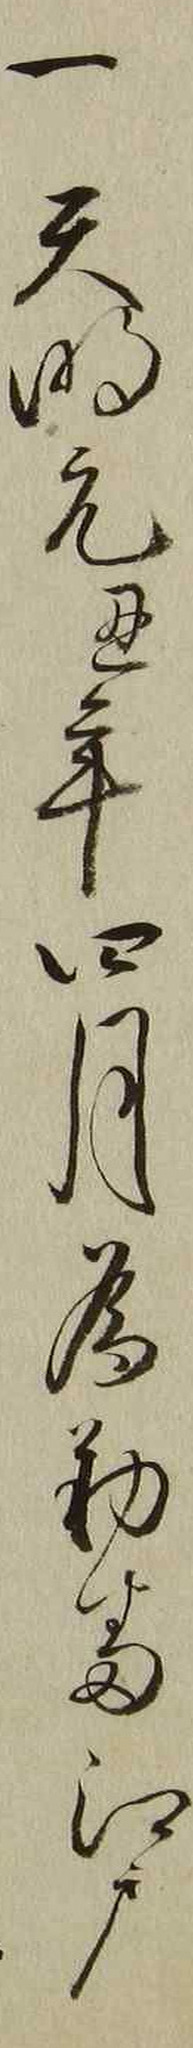一天明元丑年四月為勤番江戸
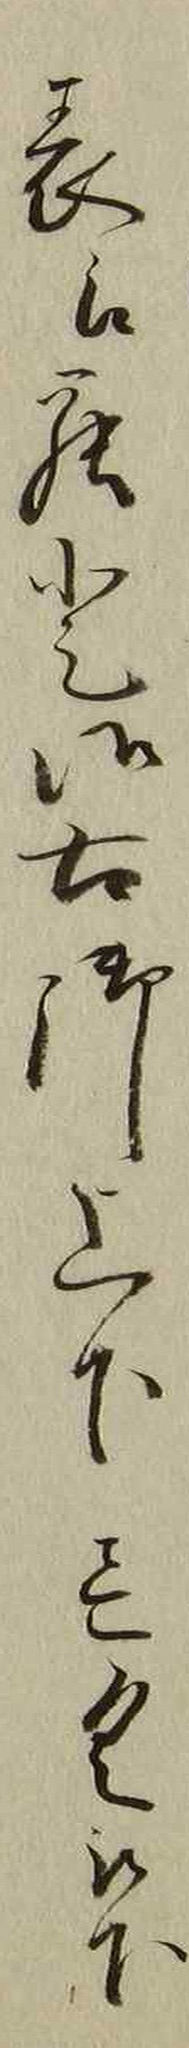表江罷登御古上下壱具被下
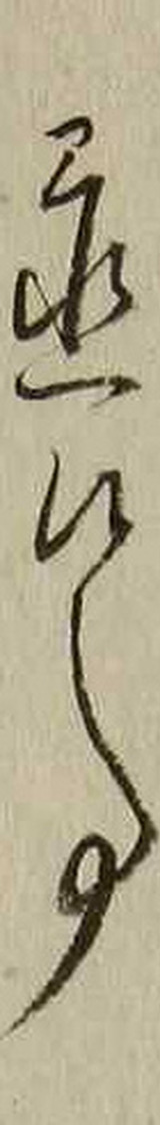置候事
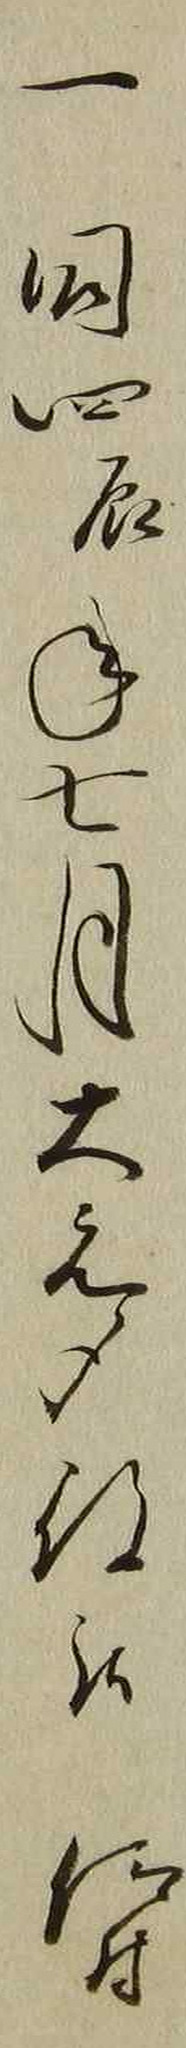一同四辰年七月大元〆役被仰付
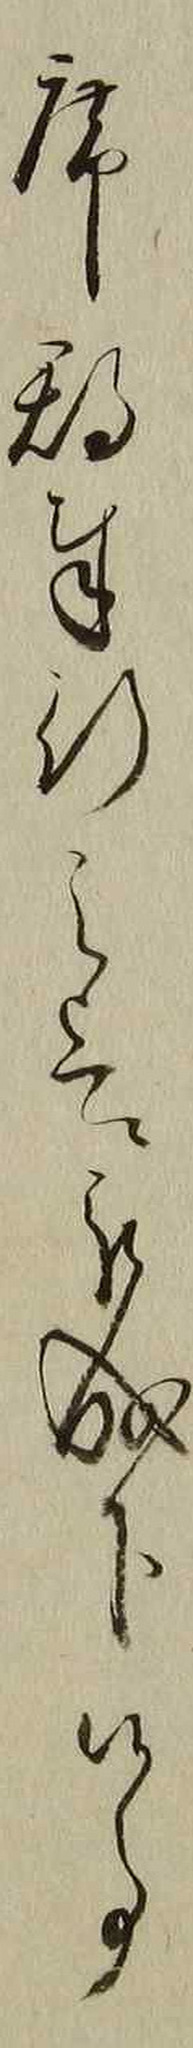席郡奉行之上ニ被成下候事
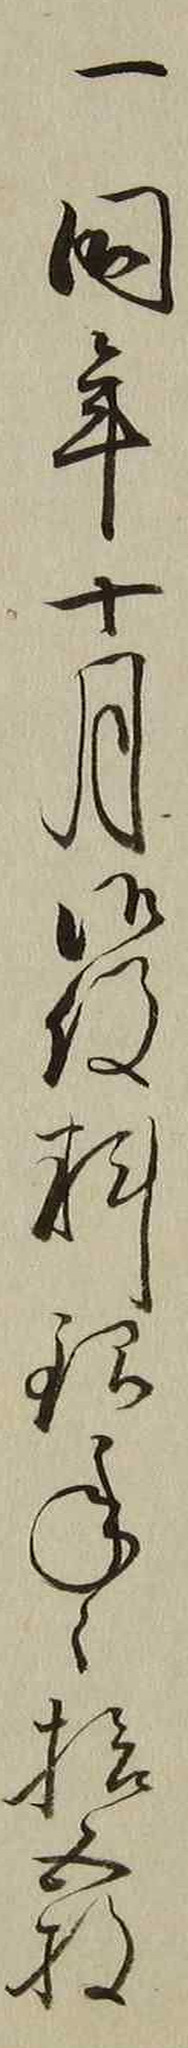一同年十月御役料銀年々拾五枚
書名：諸士系譜　巻之2　い之部2
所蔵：会津若松市立会津図書館
